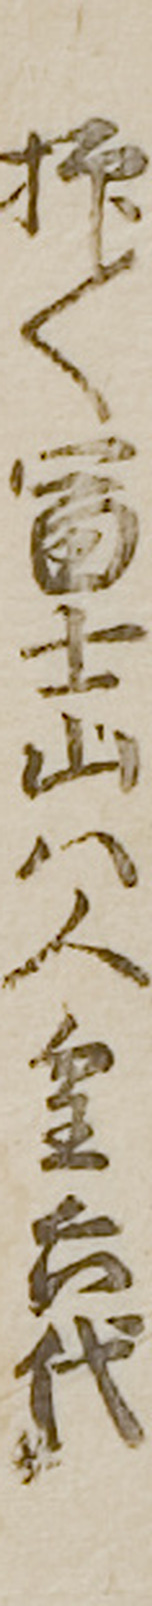抑々富士山は人皇六代
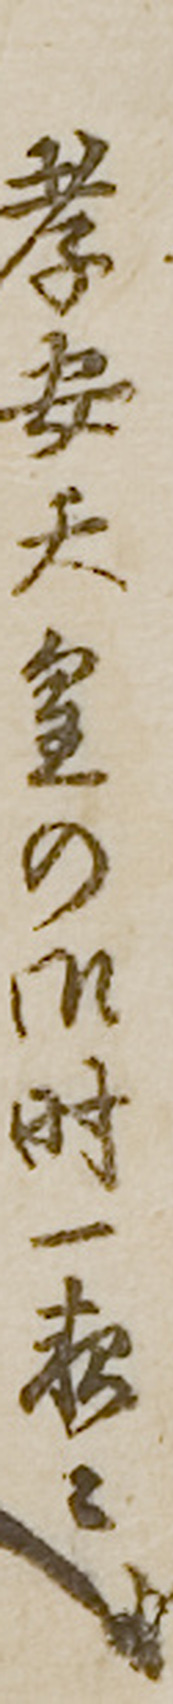孝安天皇の御時一夜に
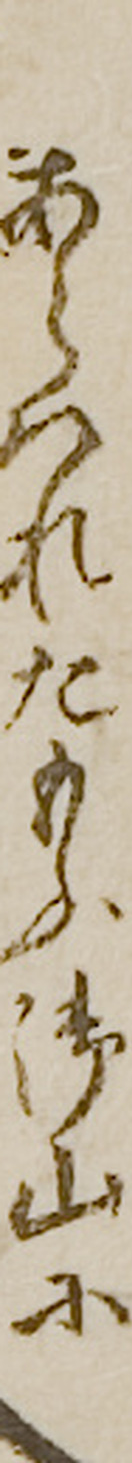あらはれたもふ御山に
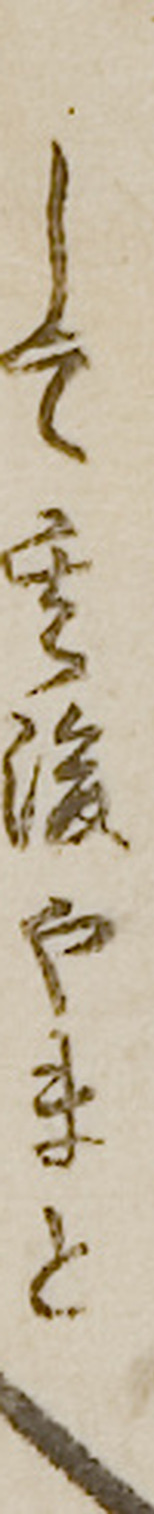して其後やまと
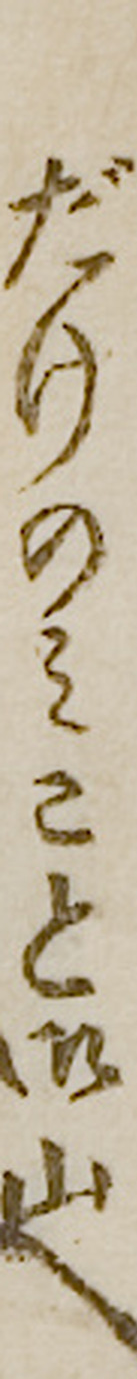だけのみこと御山
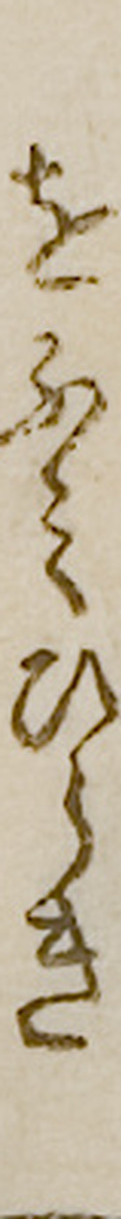をふみひらき
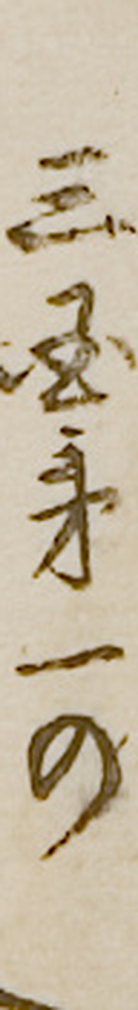三国第一の
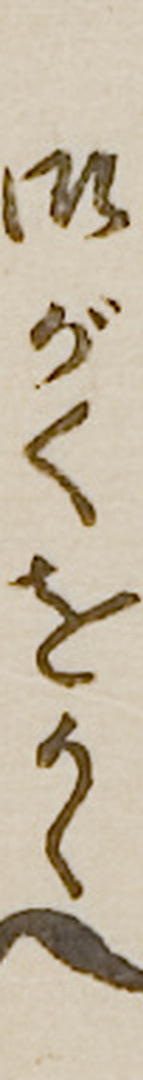御がくをかく
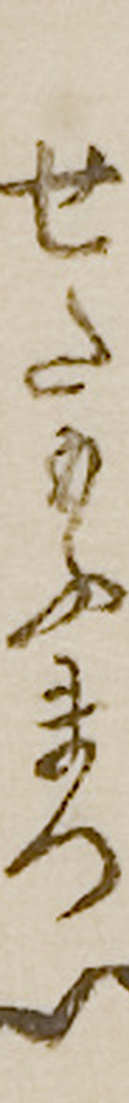せたもふまつ
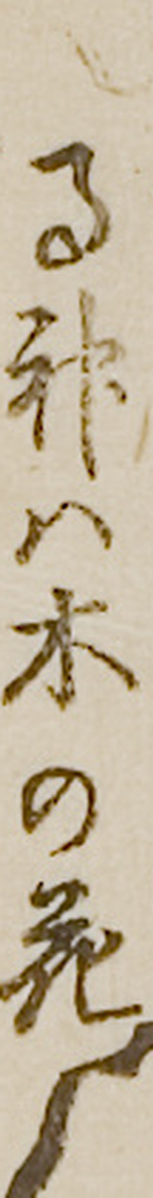る神は木の花
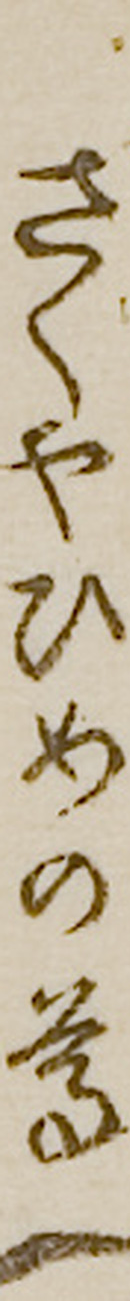さくやひめの尊
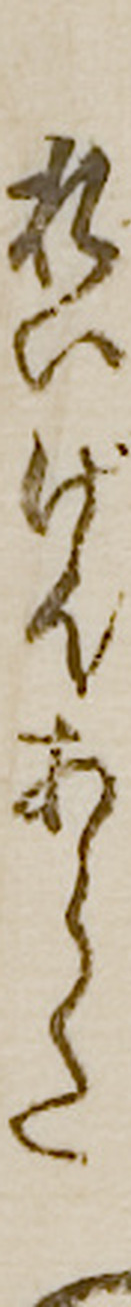れいげんあらた
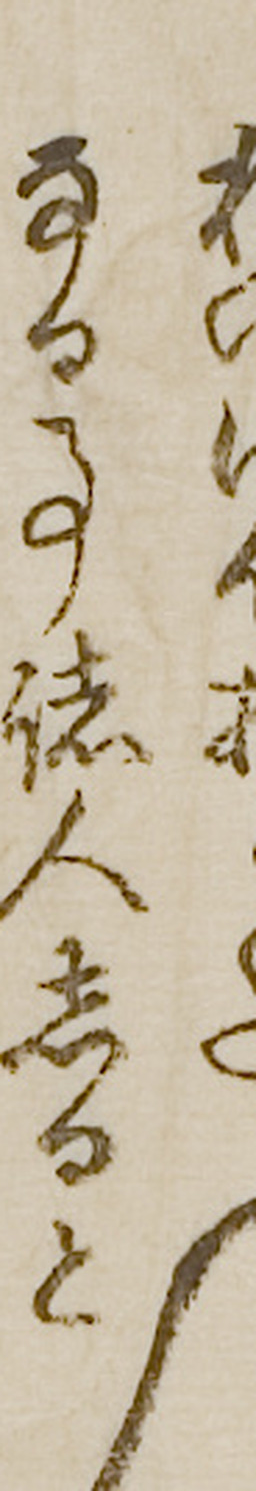なる事諸人しると
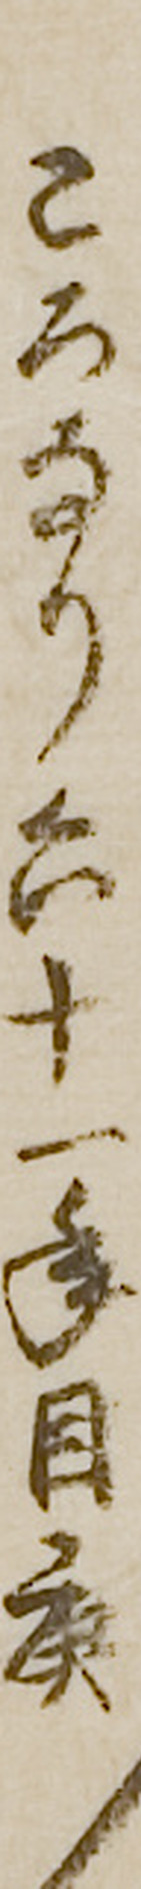ころなり六十一年目庚
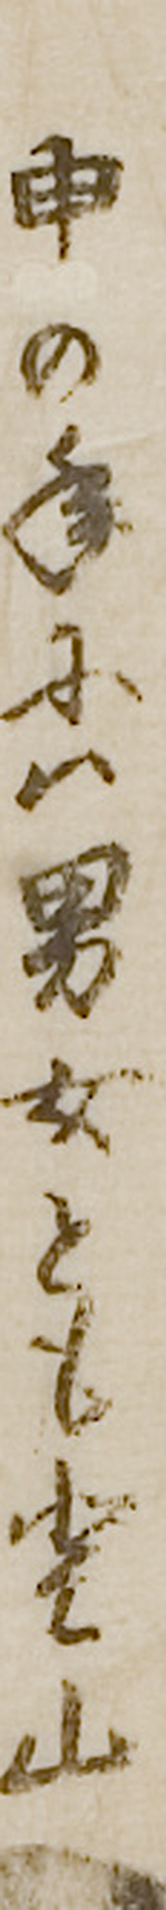申の年には男女とも登山
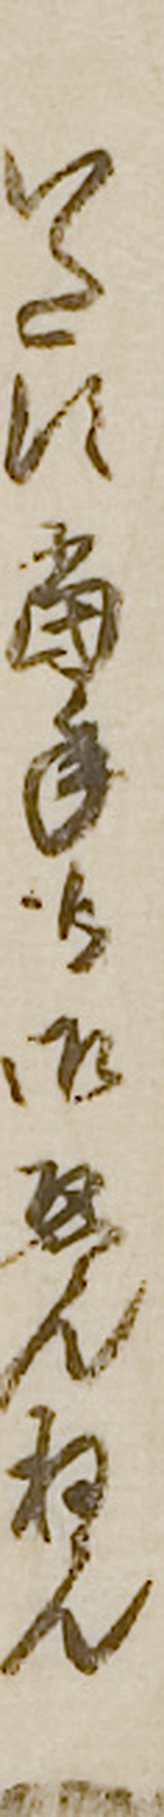いたす当年御ゑんねん
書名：[富士山に異国人登山]
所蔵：東京大学総合図書館 General Library in the University of Tokyo, JAPAN
